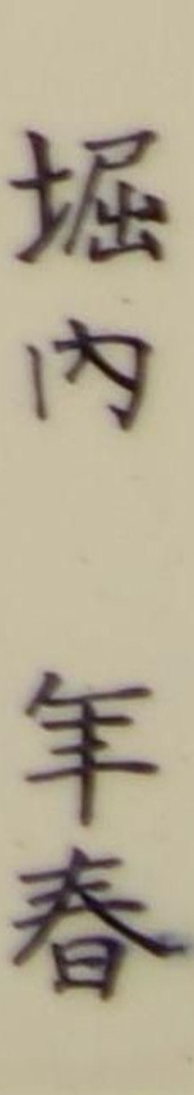堀内年春
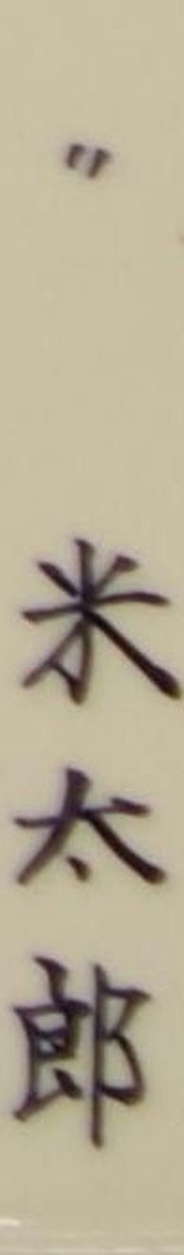米太郎
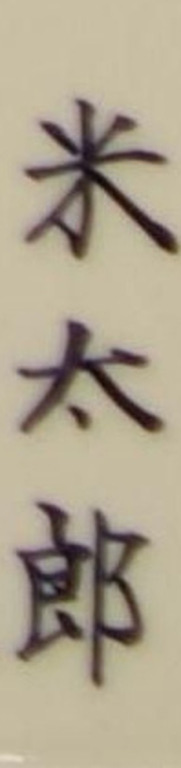米太郎
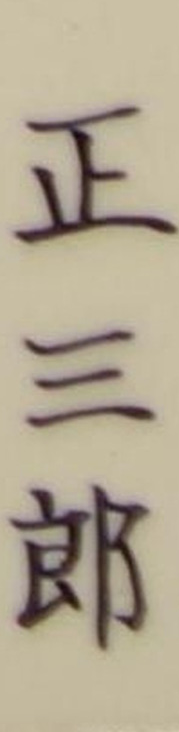正三郎
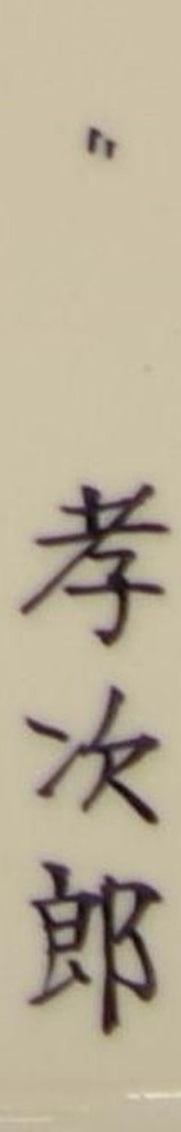孝次郎
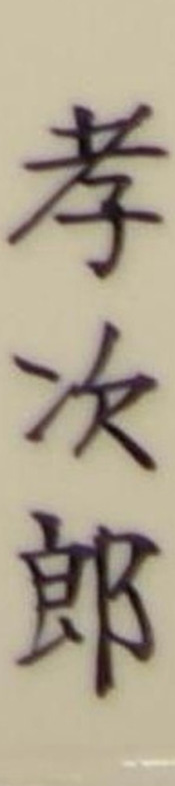孝次郎
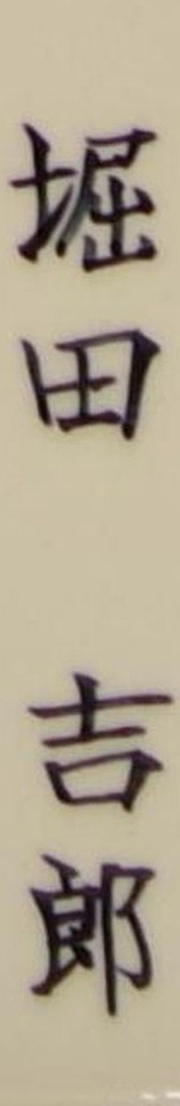堀田吉郎
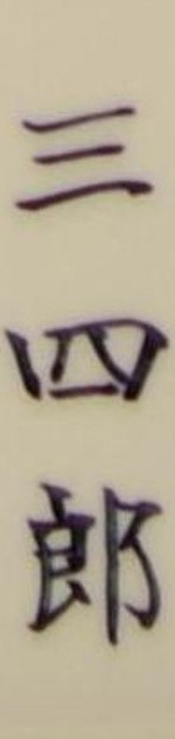三四郎
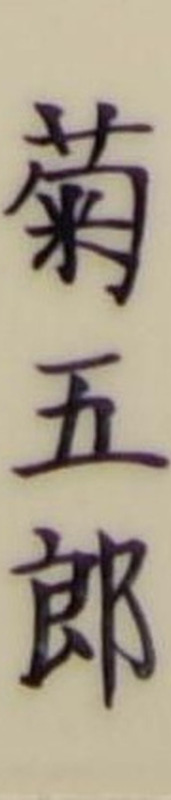菊五郎
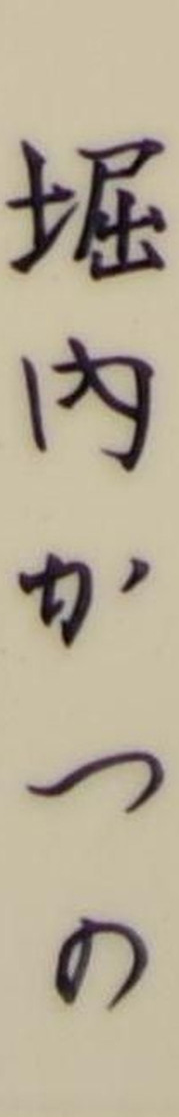堀内かつの
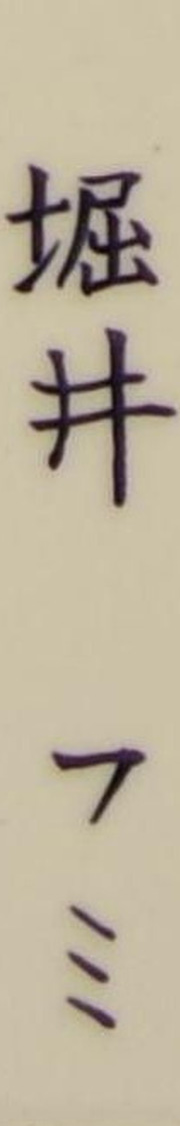堀井フミ
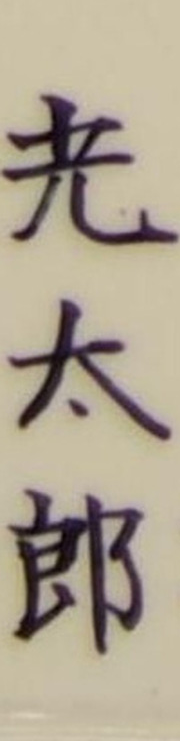光太郎

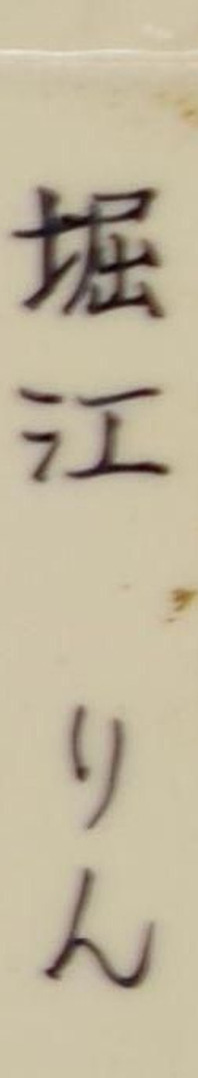堀江りん
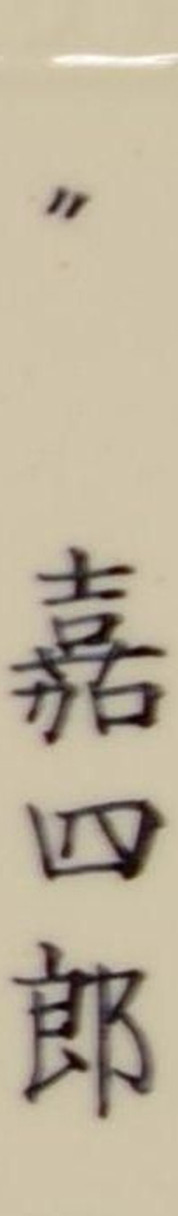嘉四郎
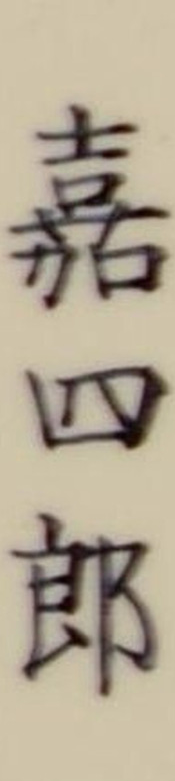嘉四郎
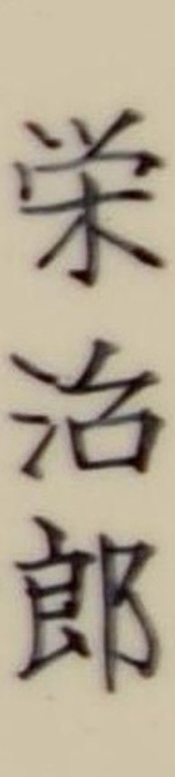栄治郎
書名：A~D
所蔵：koyasan kongobuji
